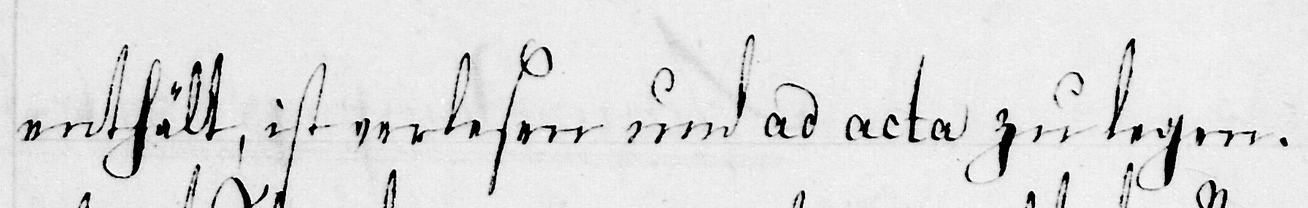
enthält, ist verlesen und ad acta zu legen.
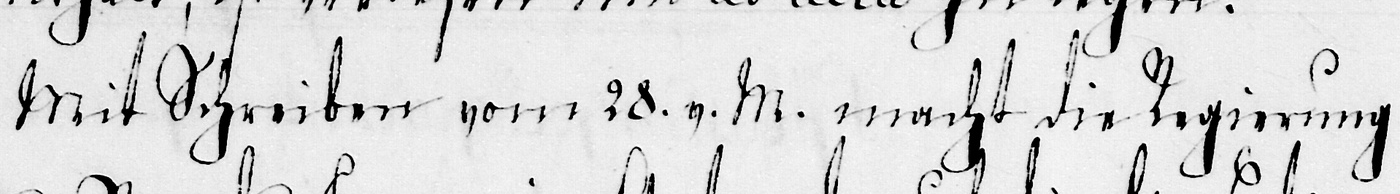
Mit Schreiben vom 28. v. M. macht die Regierung
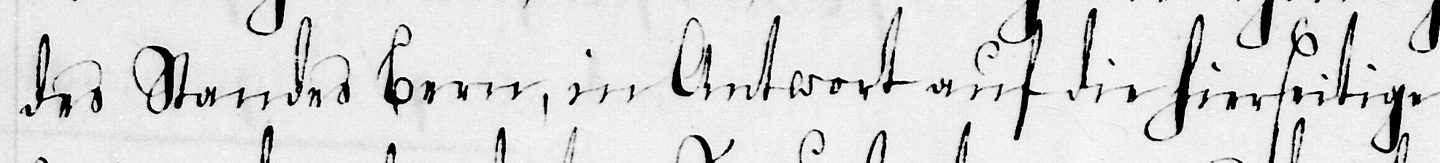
des Standes Bern, in Antwort auf die hierseitige
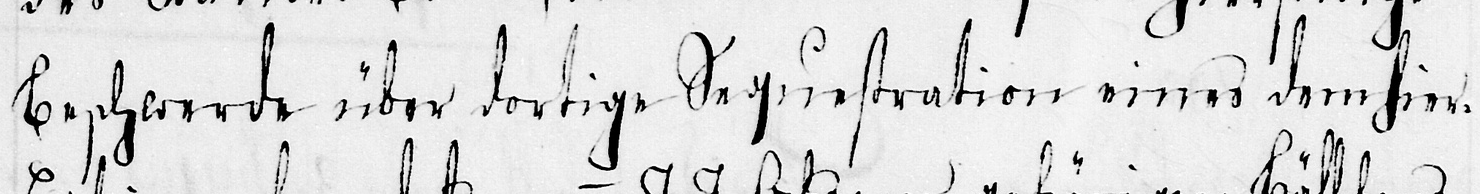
Beschwerde über dortige Sequestration eines dem hier¬
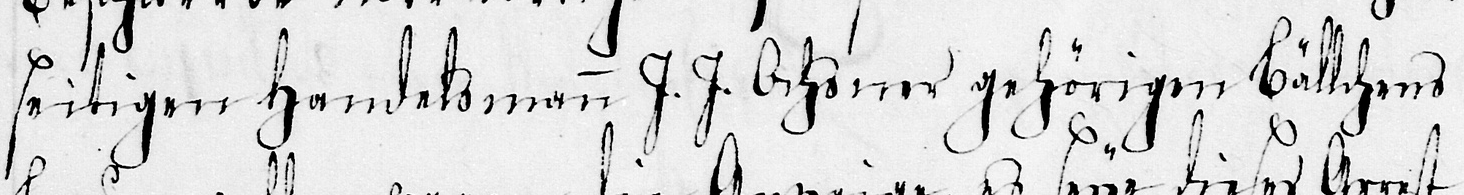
seitigen Handelsmann J. J. Ochsner gehörigen Bällchens
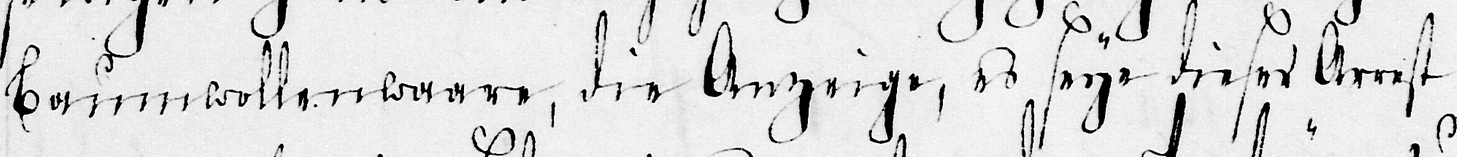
Baumwollenwaare, die Anzeige, es seye dieser Arrest
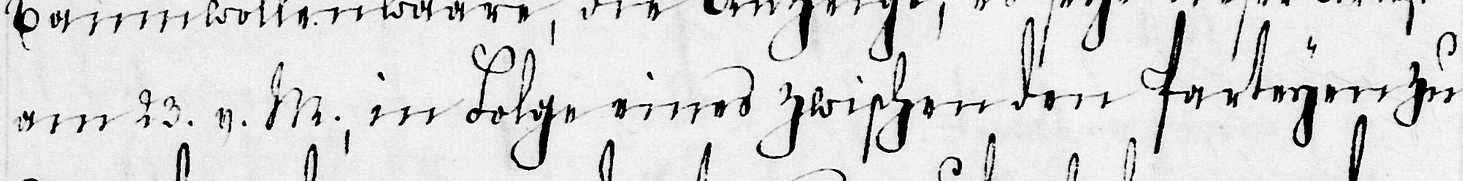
vom 23. v. M., in Folge eines zwischen den Parteyen zu
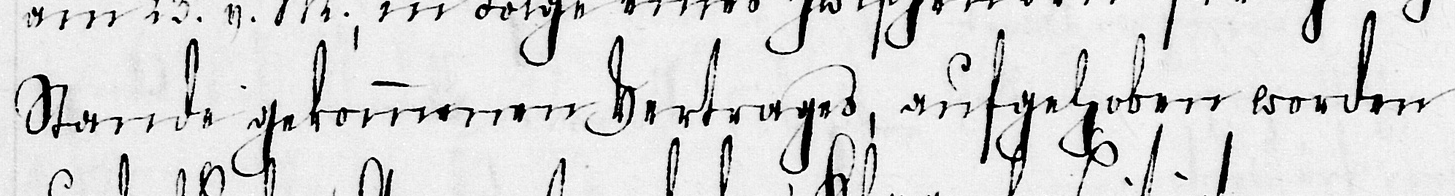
Stande gekommenen Vertrages, aufgehoben worden
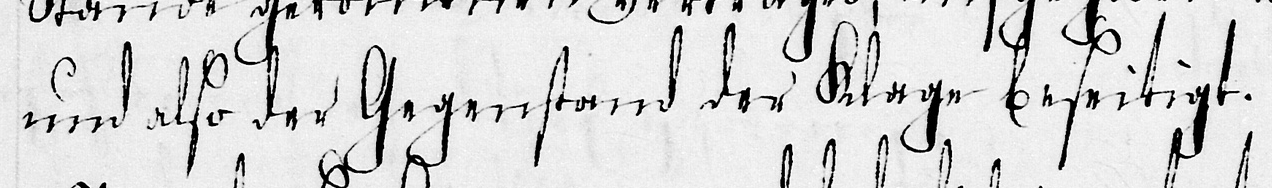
und also der Gegenstand der Klage beseitigt.
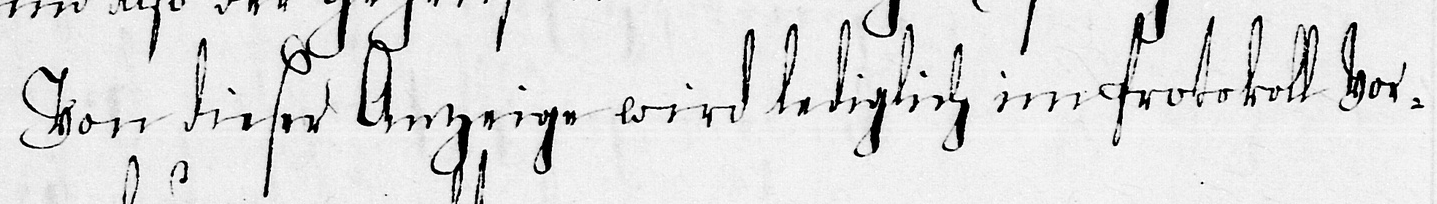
Von dieser Anzeige wird lediglich im Protokoll Vor¬
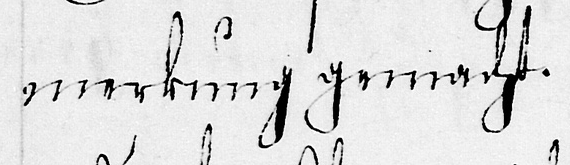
merkung gemacht.
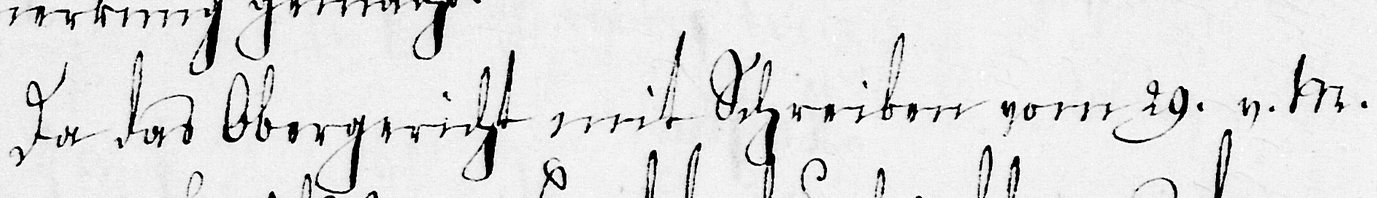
Da das Obergericht mit Schreiben vom 29. v. M.
